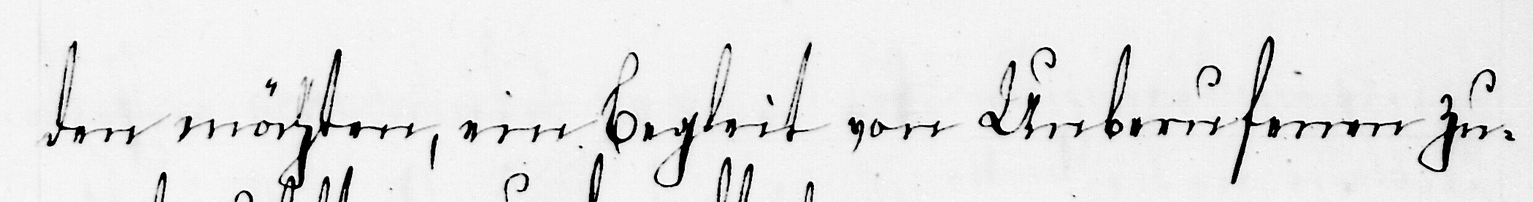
den möchten, ein Begleit von Unberufenen zu¬
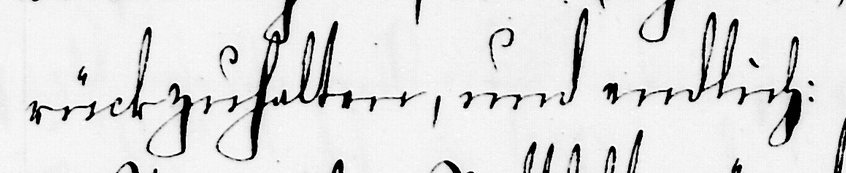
rückzuhalten, und endlich:
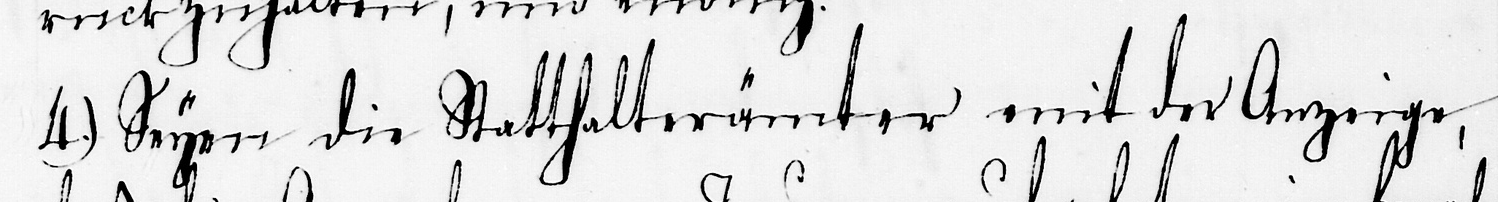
4.) Seyen die Statthalterämter mit der Anzeige,
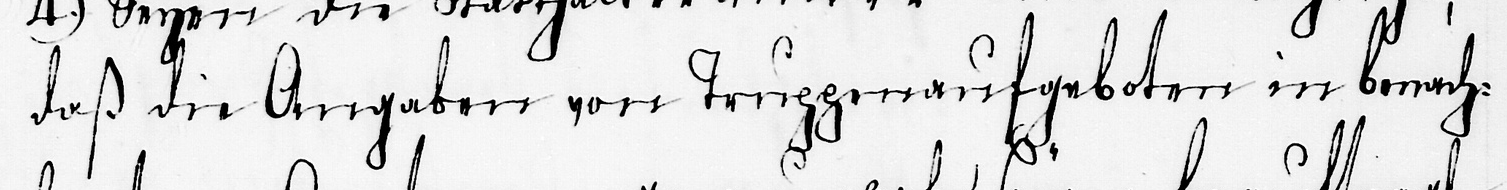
daß die Angaben von Truppenaufgeboten in benach¬
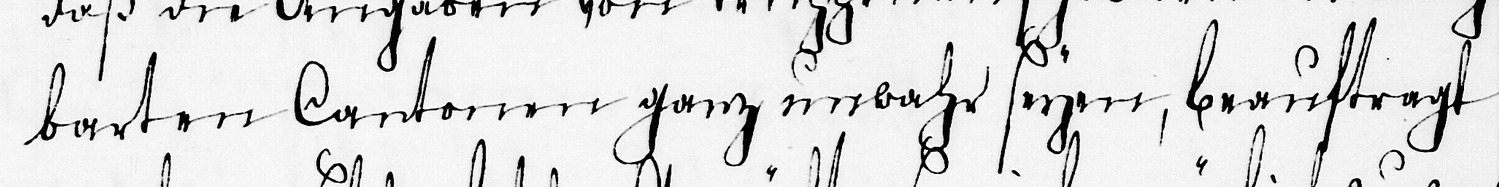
barten Cantonen ganz unwahr seyen, beauftragt
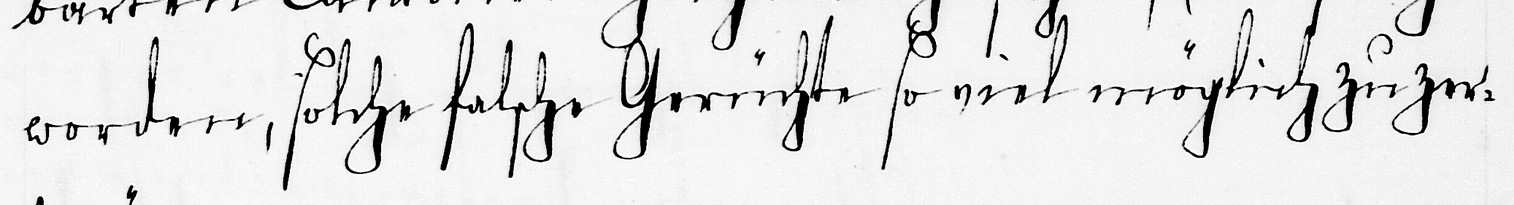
worden, solche falsche Gerüchte so viel möglich zu zer¬
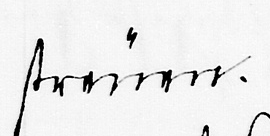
streuen.
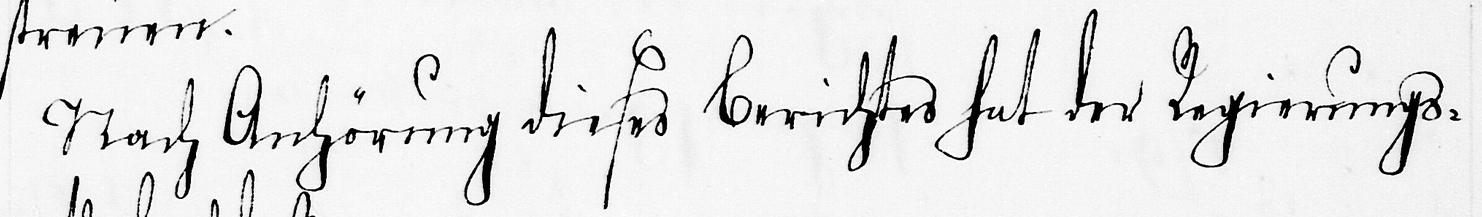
Nach Anhörung dieses Berichtes hat der Regierungs¬
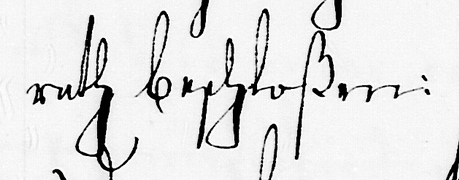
rath beschloßen:
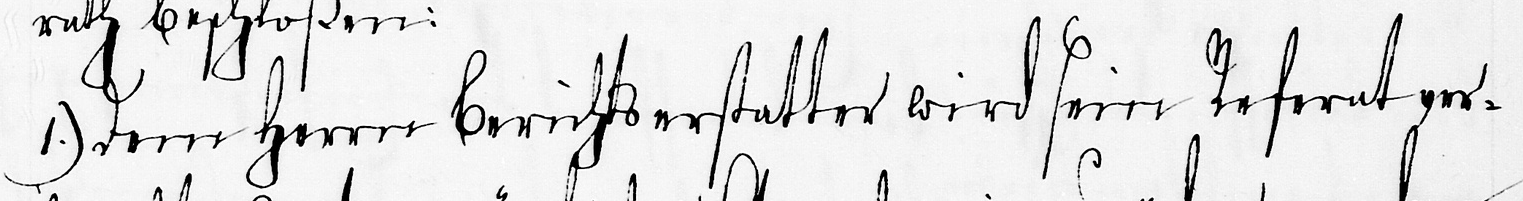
1.) Dem Herrn Berichtserstatter wird sein Referat ver¬
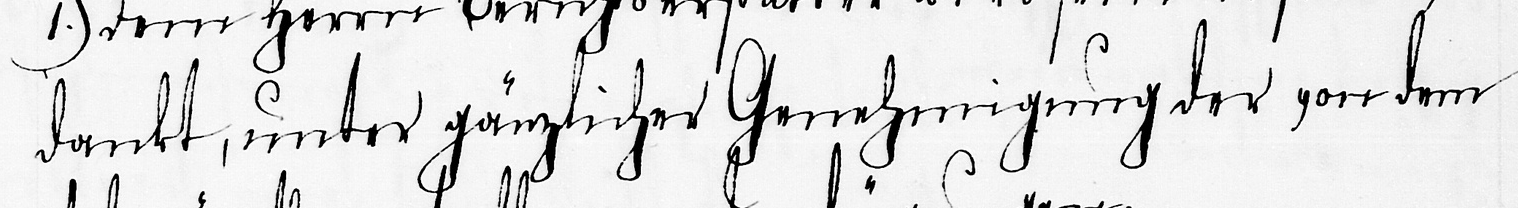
dankt, unter gänzlicher Genehmigung der von dem
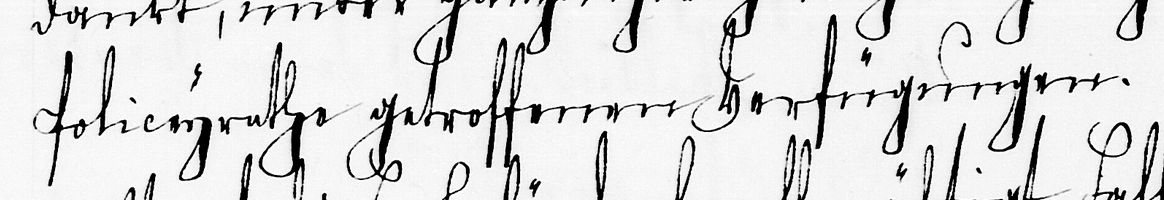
Policeyrathe getroffenen Verfügungen.
